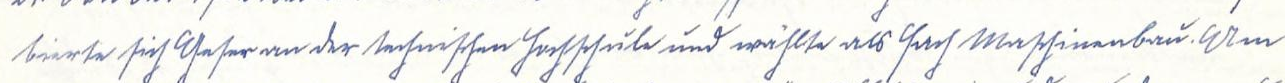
bierte sich Geser an der technischen Hochschule und wählte als Fach Maschinenbau. Am
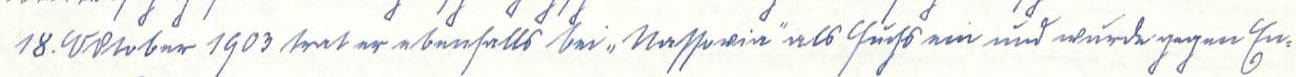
18. Oktober 1903 trat er ebenfalls bei „Nassowia“ als Fuchs ein und wurde gegen En-
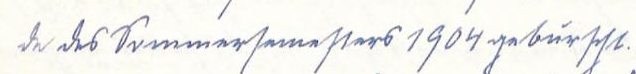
de des Sommersemester 1904 geburscht.
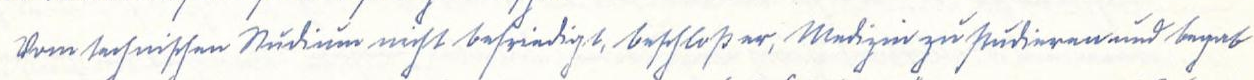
Vom technischen Studium nicht befriedigt, beschloß er, Medizin zu studieren und begab
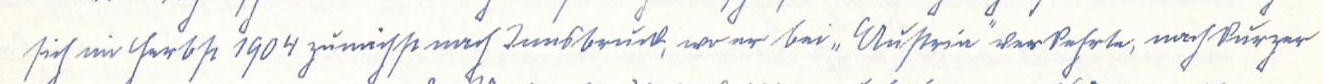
sich im Herbst 1904 zunächst nach Innsbruck, wo er bei“ Austria“ verkehrte, nach kurzer
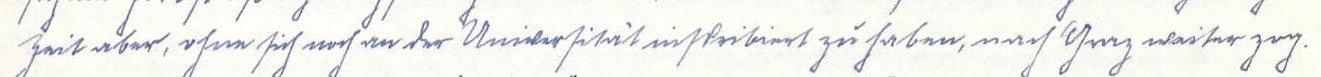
Zeit aber, ohne sich noch an der Universität inskribiert zu haben, nach Graz weiterzog.
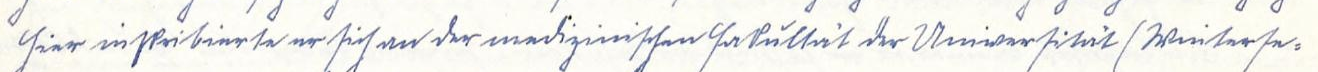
Hier inskribierte er sich an der medizinischen Fakultät der Universität (Winterse-
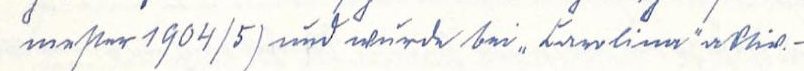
mester 1904/5) und wurde bei „Carolina“ aktiv.
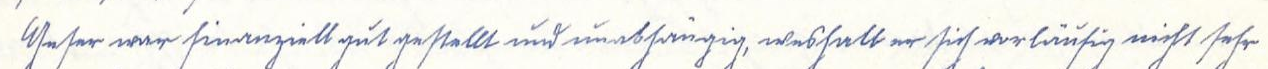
Geser war finanziell gut gestellt und unabhängig, weshalb er sich vorläufig nicht sehr
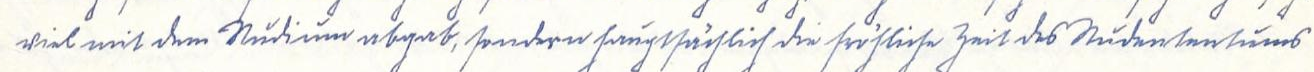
viel mit dem Studium abgab, sondern hauptsächlich die fröhliche Zeit des Studententums
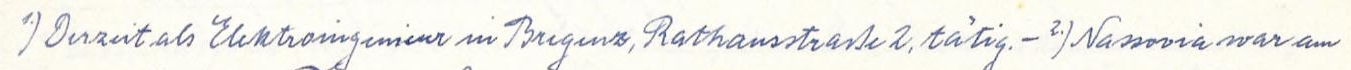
1) Derzeit als Elektroingenieur in Bregenz, Rathausstraße 2. – 2) Nassowia war am
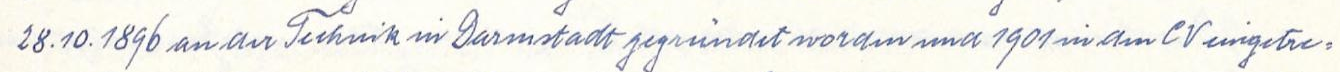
28.10.1896 an der Technik in Darmstadt gegründet worden und 1901 in den CV eingetre-
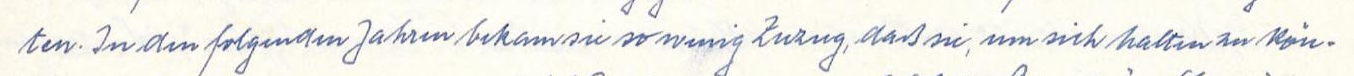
ten. In den folgenden Jahren bekam sie so wenig Zuzug, dass sie, um sich halten zu kön-
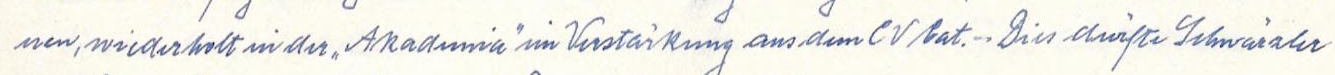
nen, wiederholt in der „Akademia“ um Verstärkung aus den CV bat. Dies dürfte Schwärzler
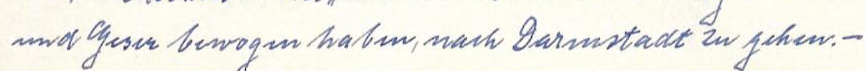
und Glaeser bewogen haben, nach Darmstadt zu gehen.-
